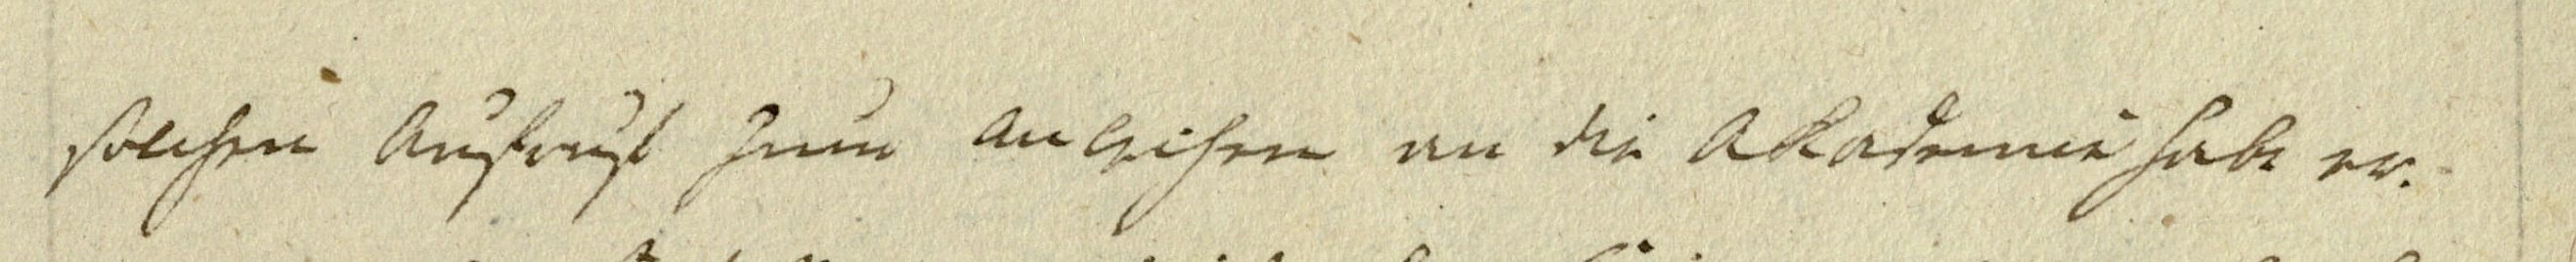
solchen Aufruf zum Anleihen an die Akademie habe er¬
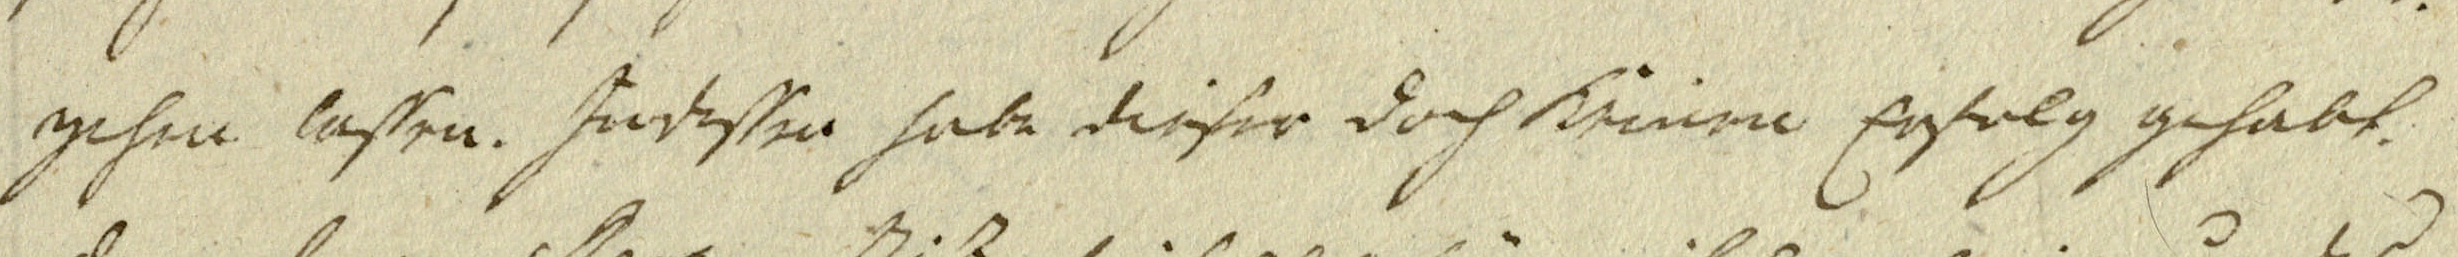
gehen lassen. Indessen habe dieser doch keinen Erfolg gehabt.
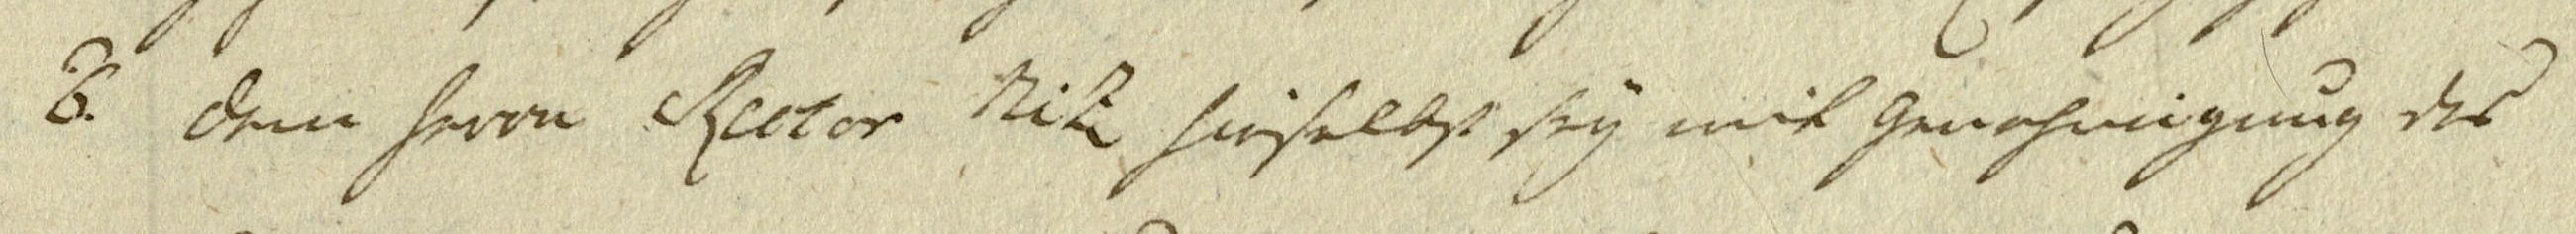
6. Dem Herrn Rector Niz hieselbst seÿ mit Genehmigung des
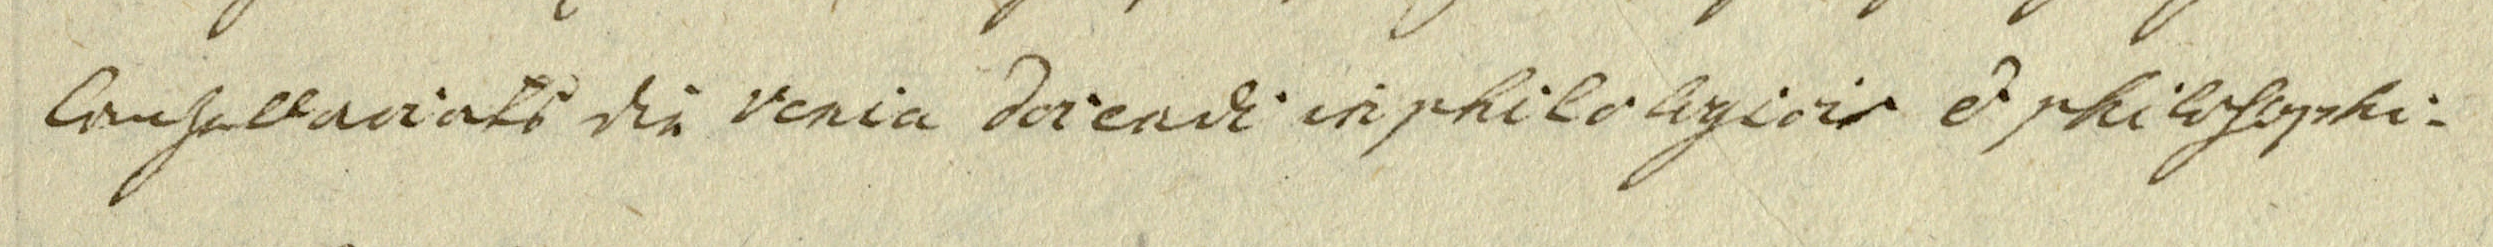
Canzellariats die venia docendi in philologicis et philosophi¬
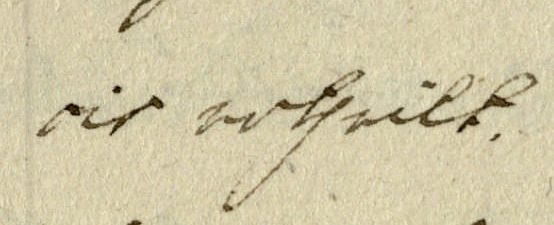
cis ertheilt.
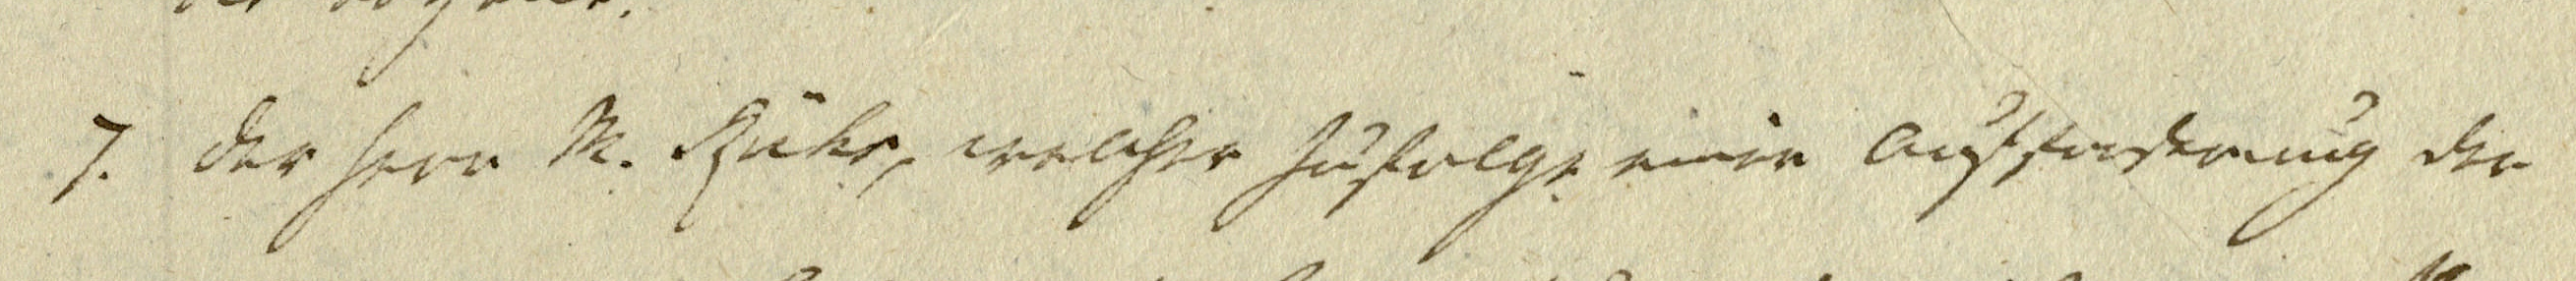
7. Der Herr M. Rühs, welcher zufolge einer Aufforderung der
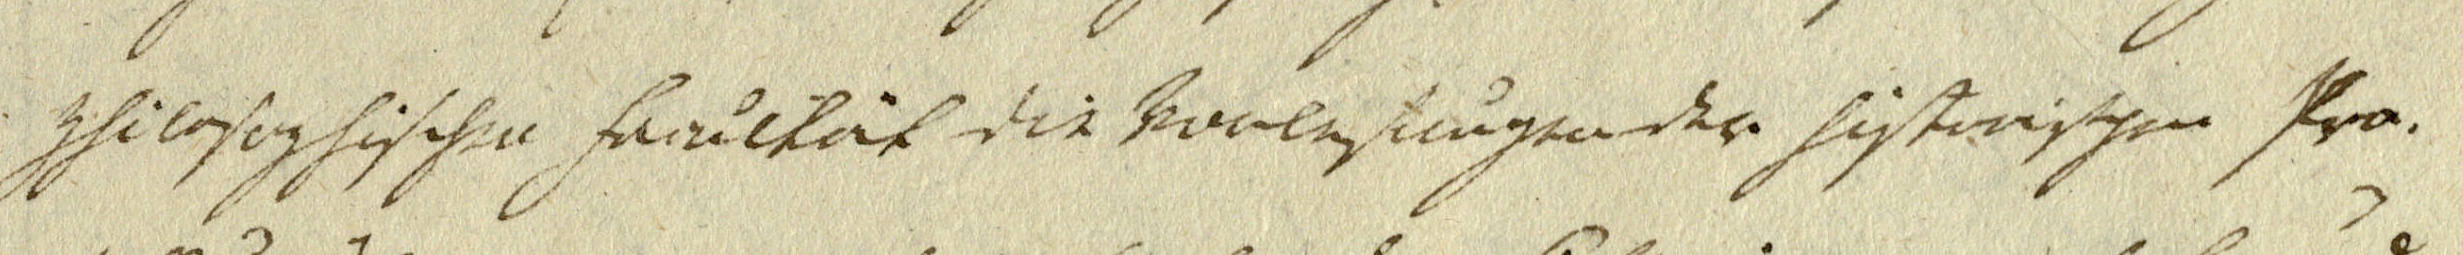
philosophischen Facultät die Vorlesungen der historischen Pro¬
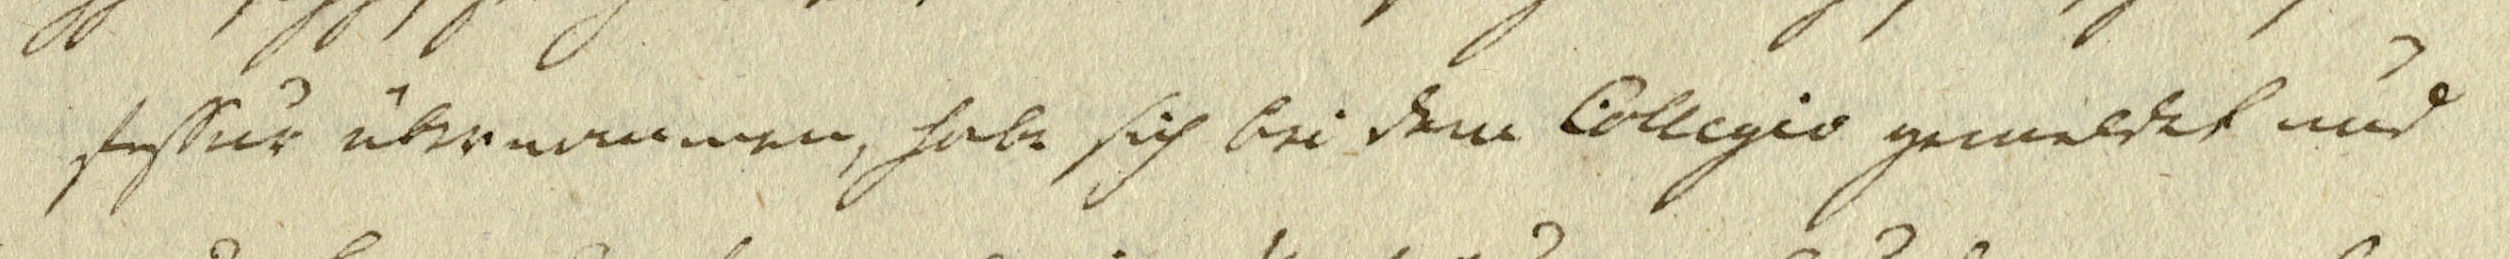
fessur übernommen, habe sich bei dem Collegio gemeldet und
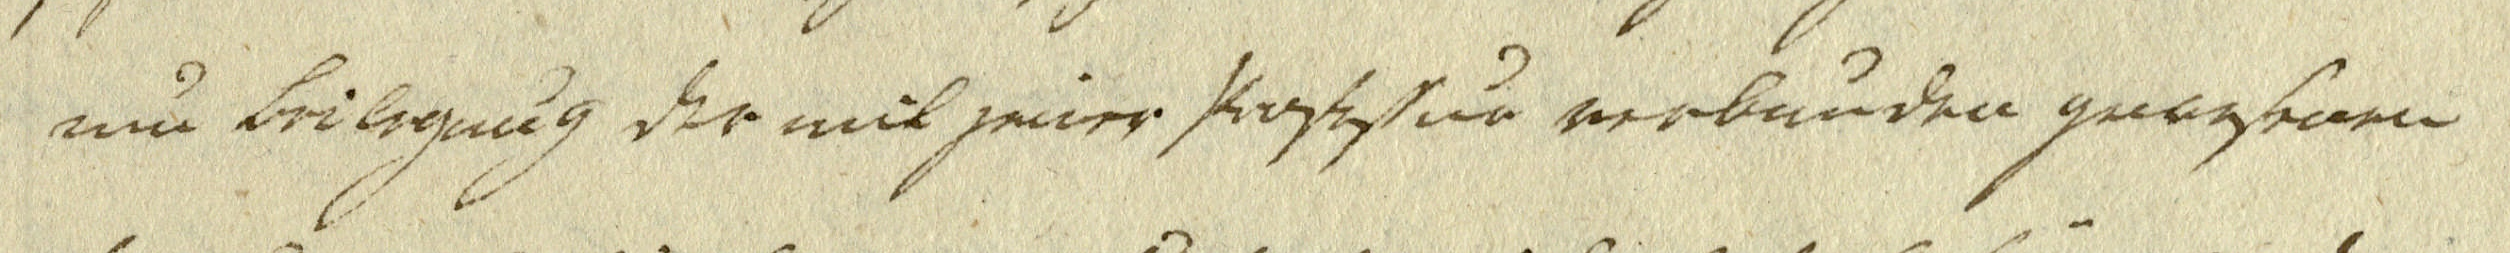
um Beilegung der mit jener Professur verbunden gewesenen
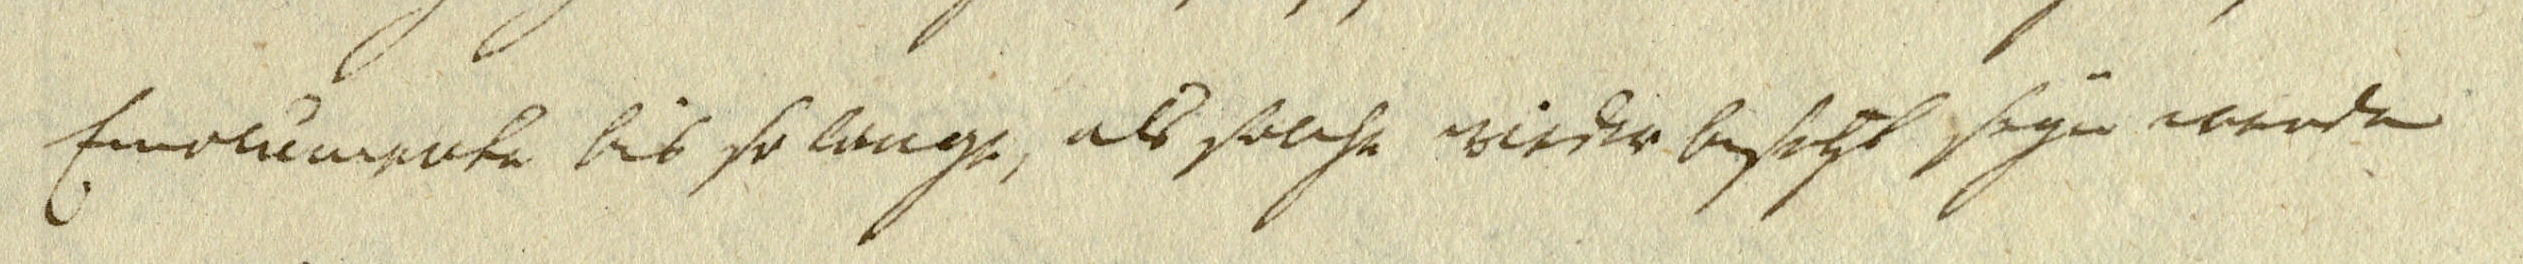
Emolumente bis so lange, als solche wieder besetzt seÿn werde
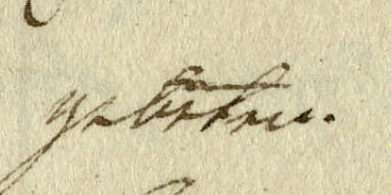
gebeten.
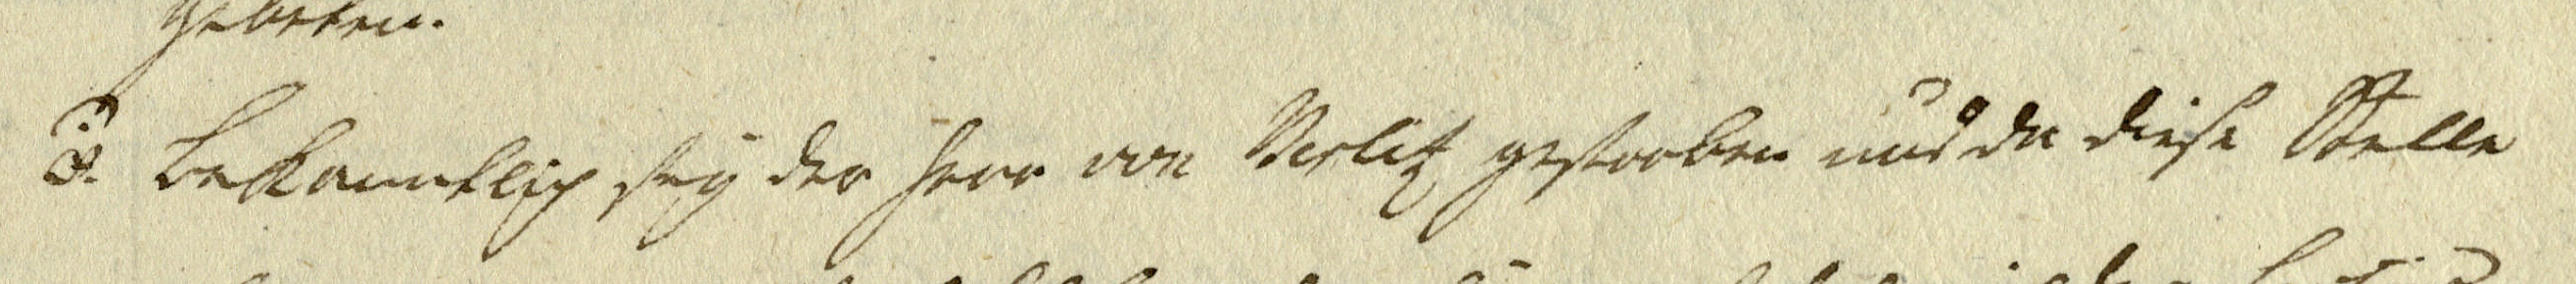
8. Bekanntlich seÿ der Herr von Berlitz gestorben und da diese Stelle
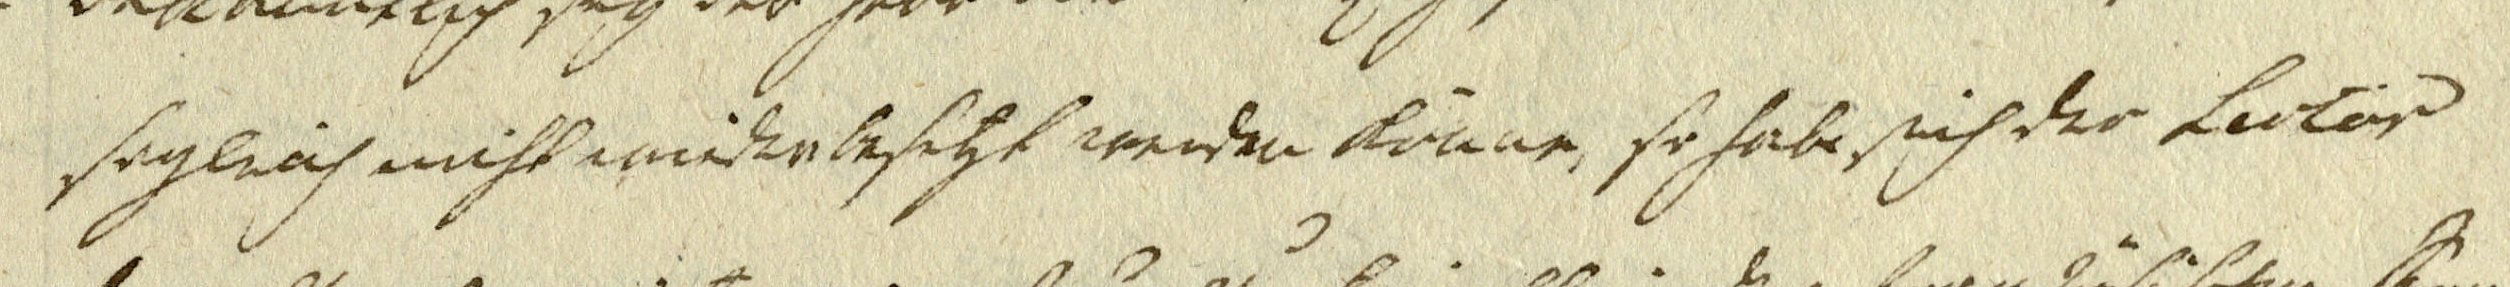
sogleich nicht wieder besetzt werden könne, so habe sich der Lector
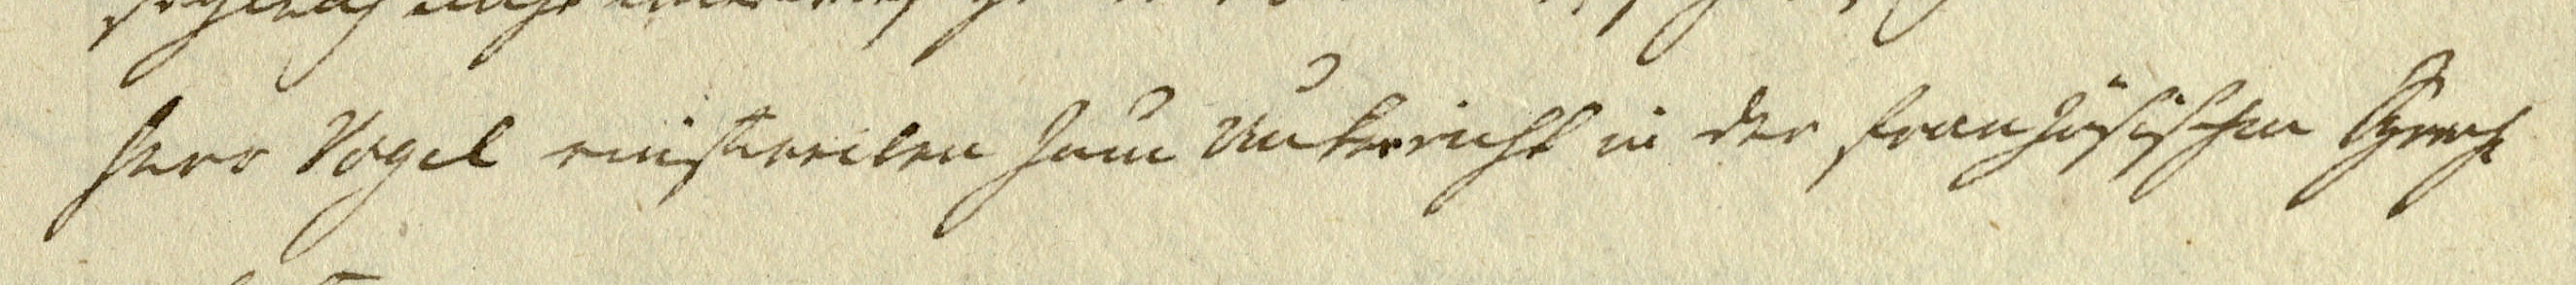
Herr Vogel einstweilen zum Unterricht in der französischen Sprache
